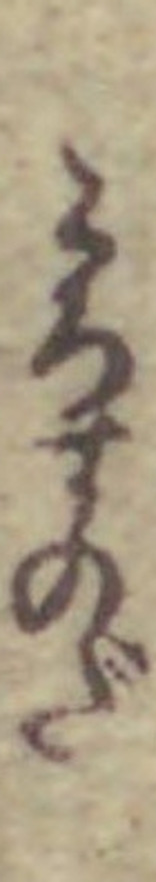ころすのだ
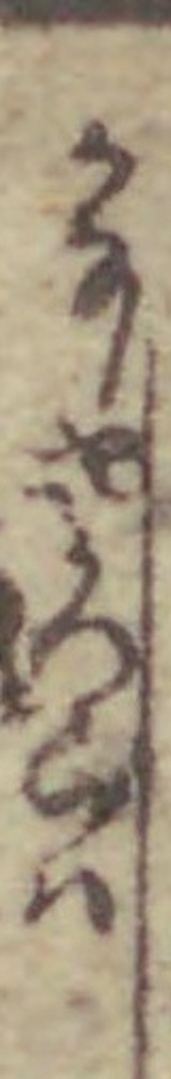かなしやかつ山は
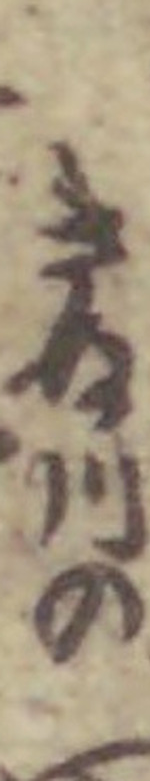きぬ川の
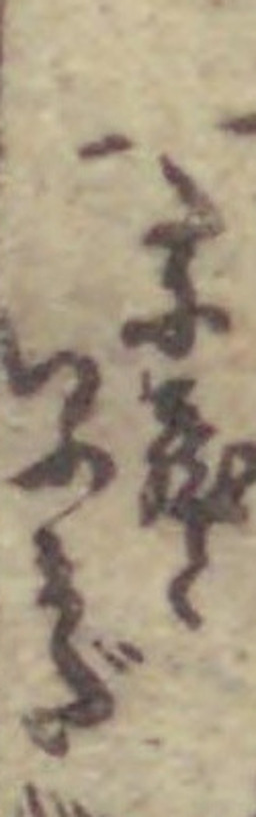いふみだ
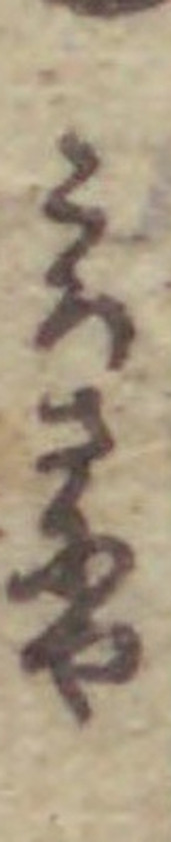ころさにや
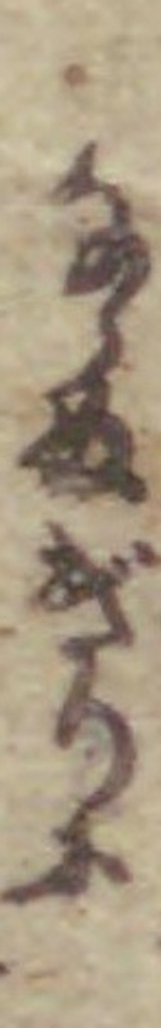ならぬぎりに
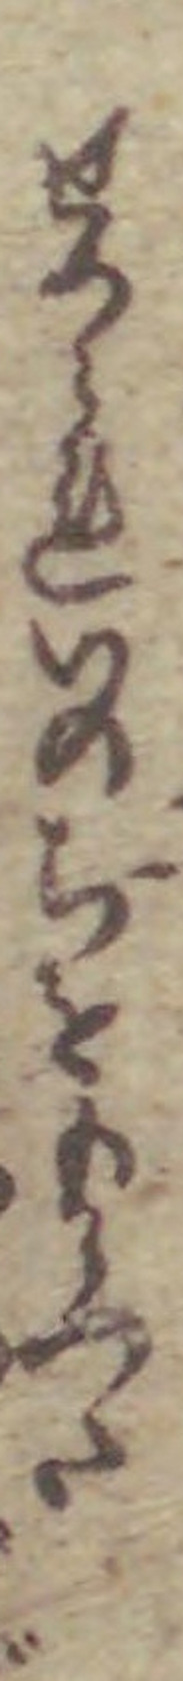せめられいのちをもらつた
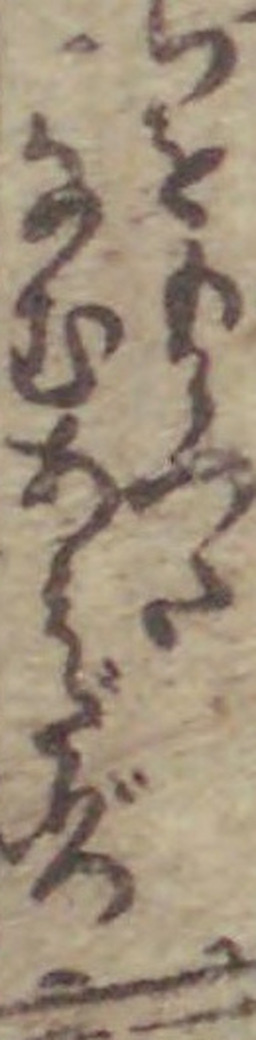なむあみだぶつ

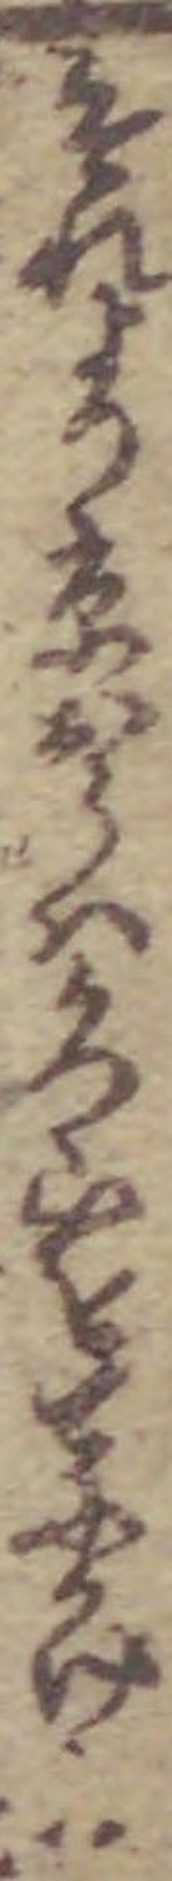それより京おうはかつ山をてにかけ
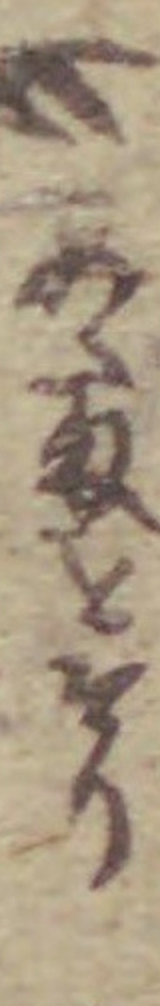あたまをそり
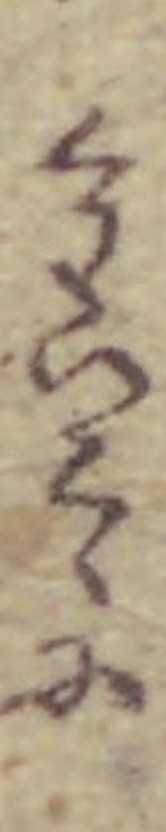くわいこくに
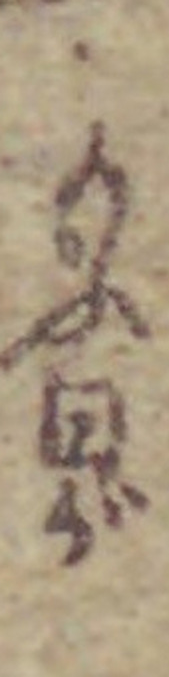もふ日が
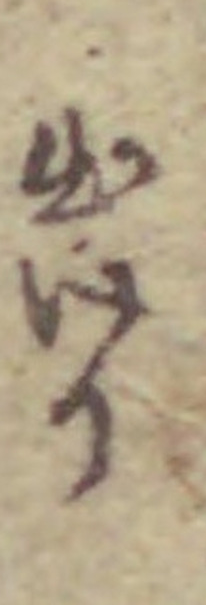出けり
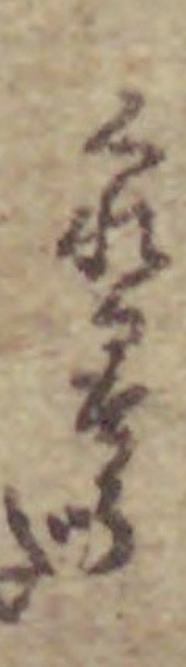くれるそう
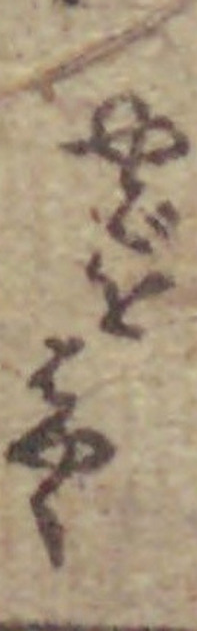やどをはやく
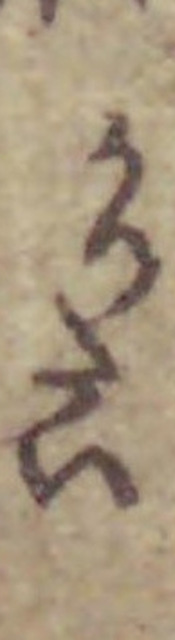かりたい
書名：大通其面影 2巻
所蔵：国立国会図書館 National Diet Library, JAPAN
